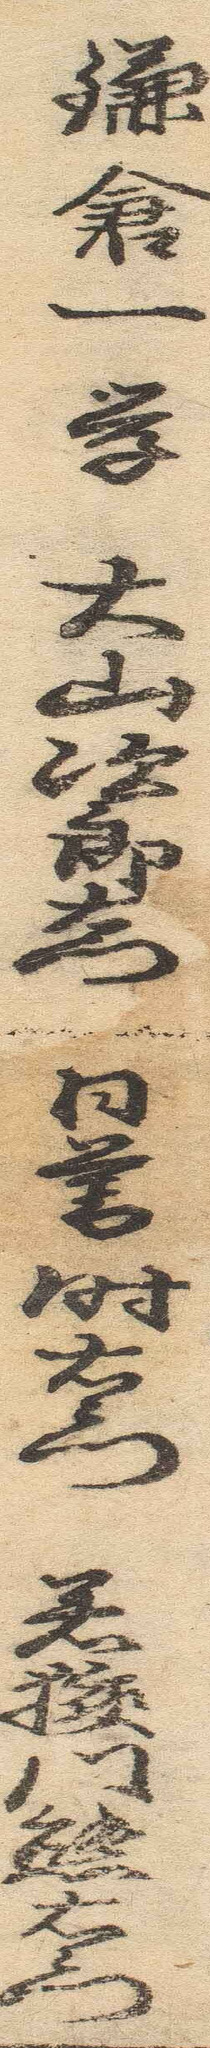鎌倉一学大山次郎右衛門日暮時右衛門若狭川熊右衛門
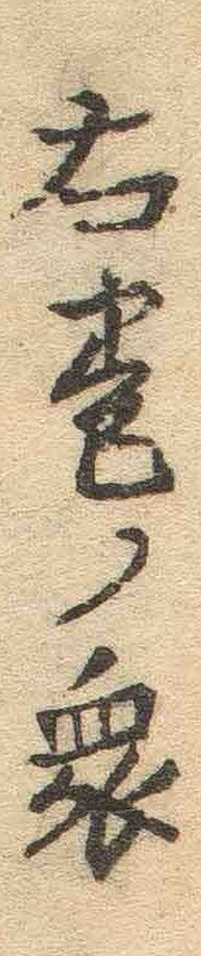右巻ノ衆
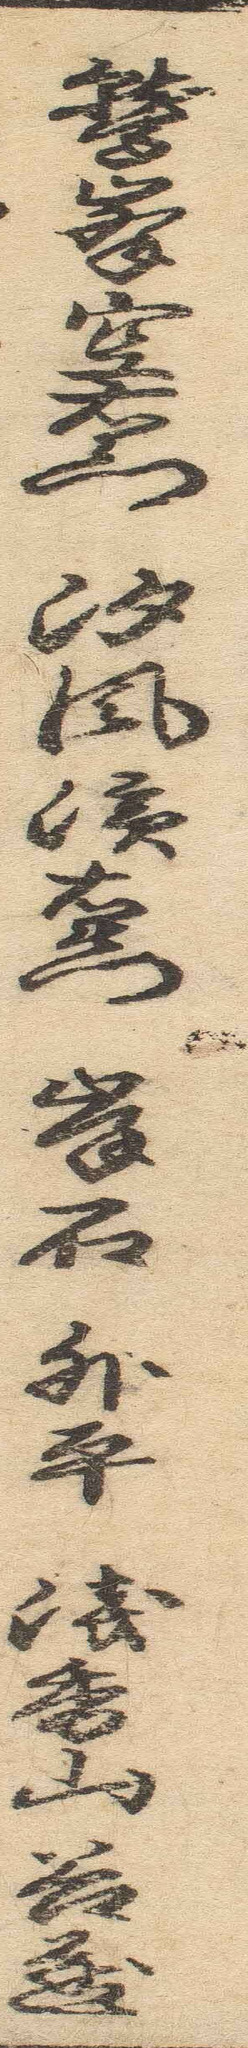鷲峯空右衛門汐風濱右衛門峯石外平浅香山谷蔵
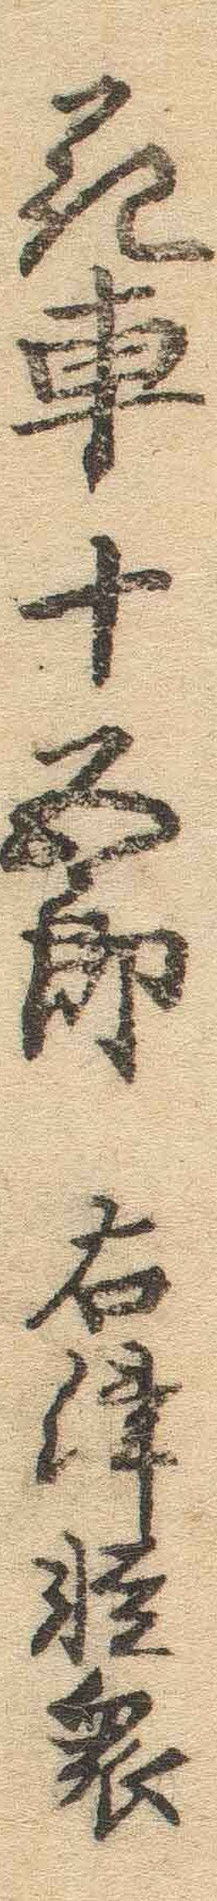花車十五郎右津軽衆
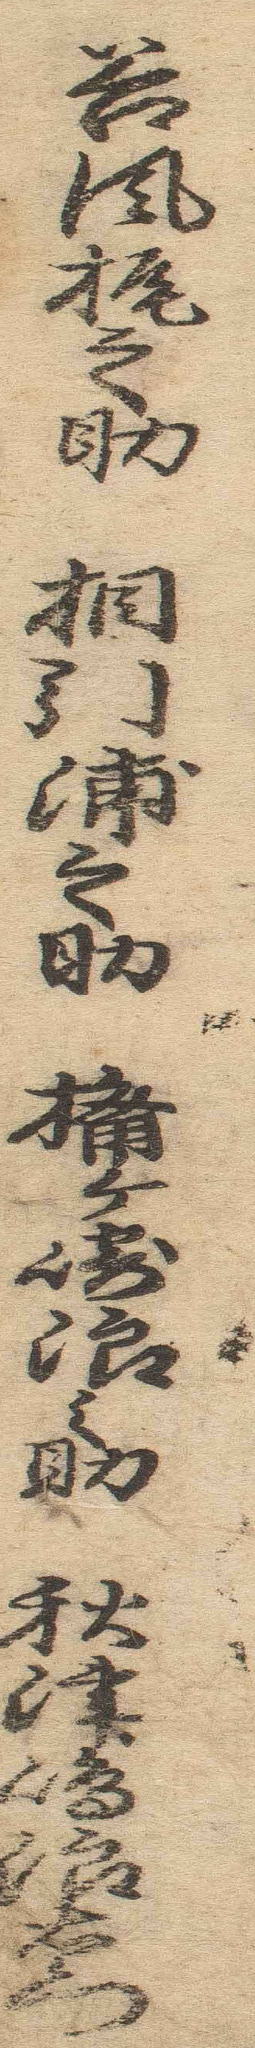谷風梶之助相引浦之助楯ケ崎浪之助秋津嶋浪右衛門
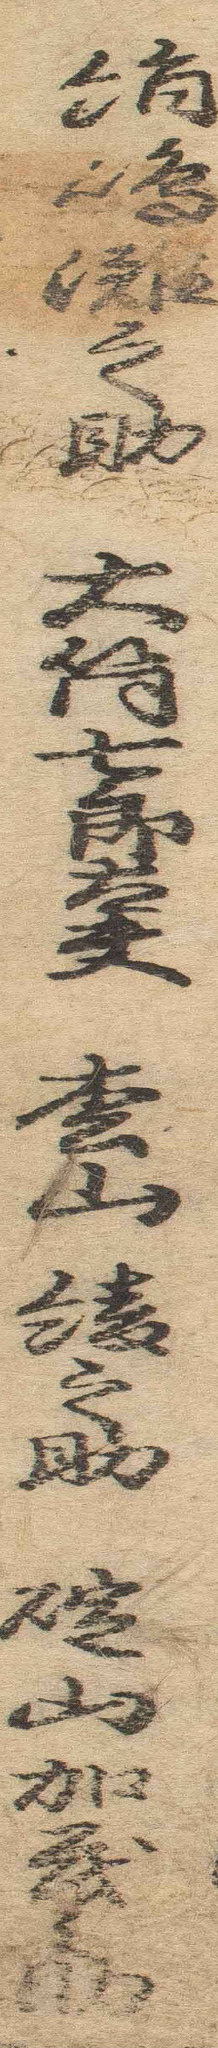絹嶋瀧之助大筒七郎太夫松山綾之助碇山加茂之助
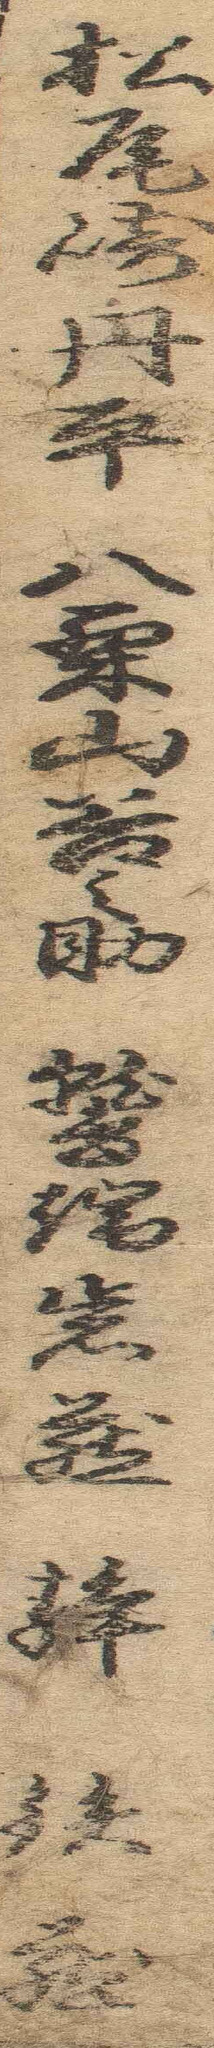松尾埼丹平八栗山谷之助鷲端岩蔵幹鉄蔵

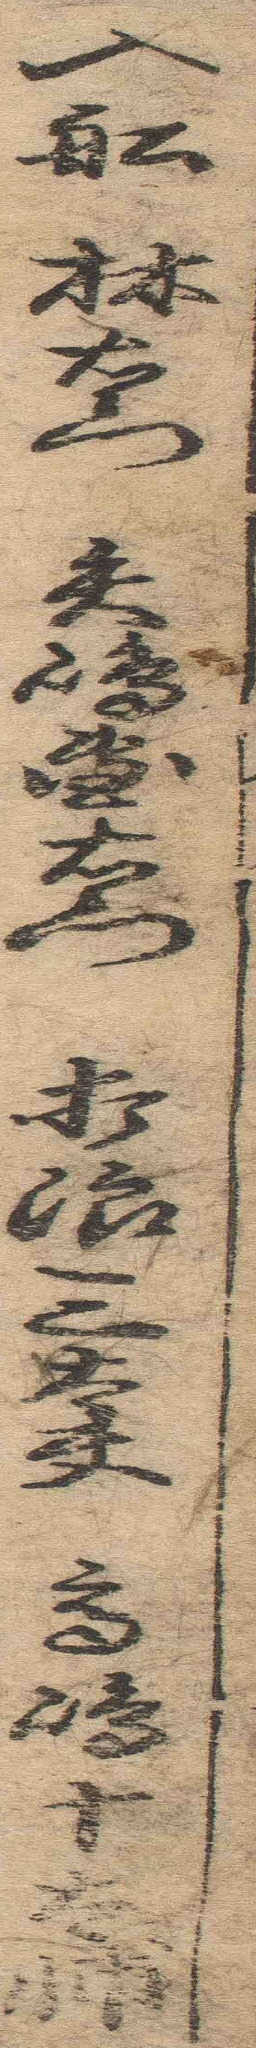入船林右衛門矢嶋団右衛門打波三太夫高嶋十太輔
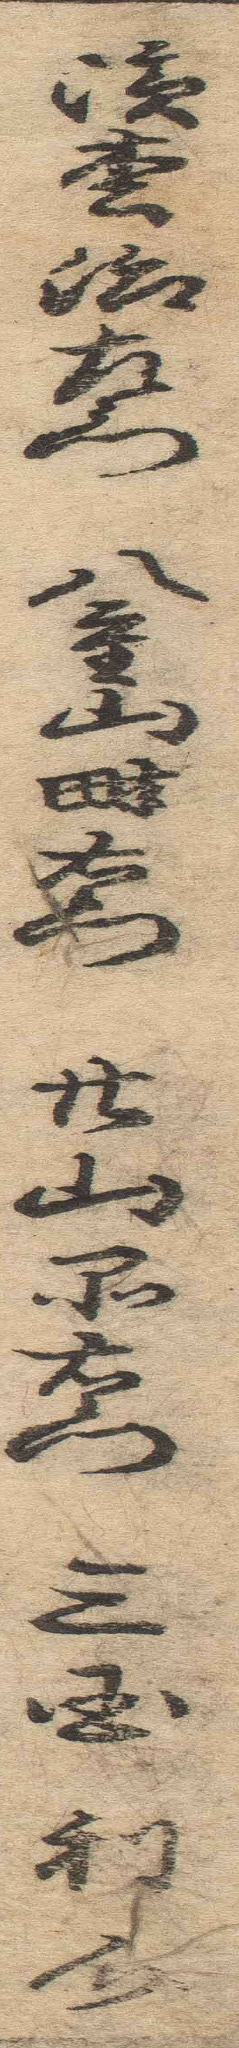浜松浪左衛門八重嶋半右衛門廿山品右衛門三国利介
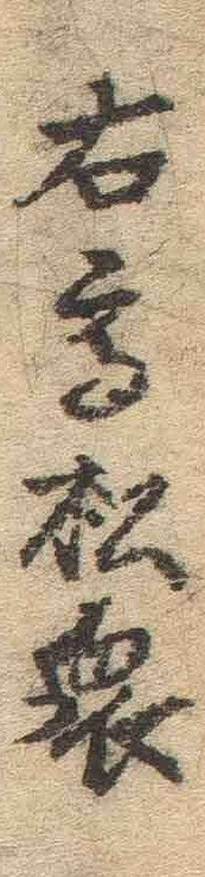右高松衆
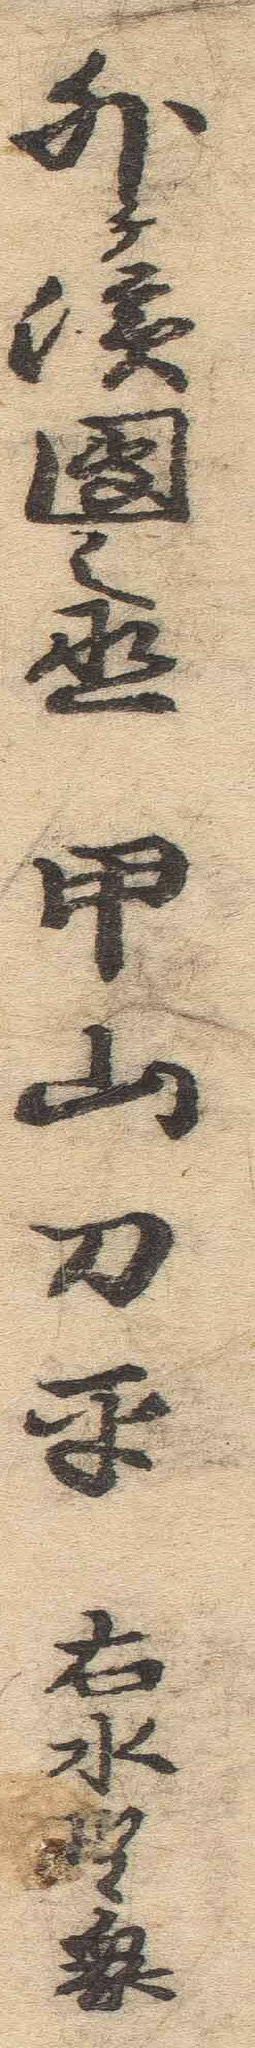外ケ浜団之丞甲山刀平右水野衆
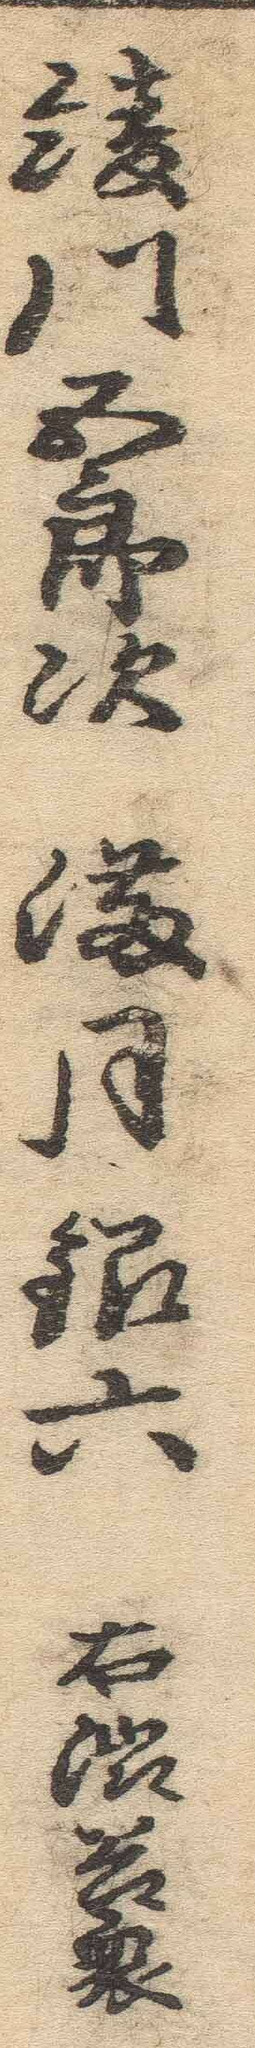綾川五郎次満月銀六右渋谷衆
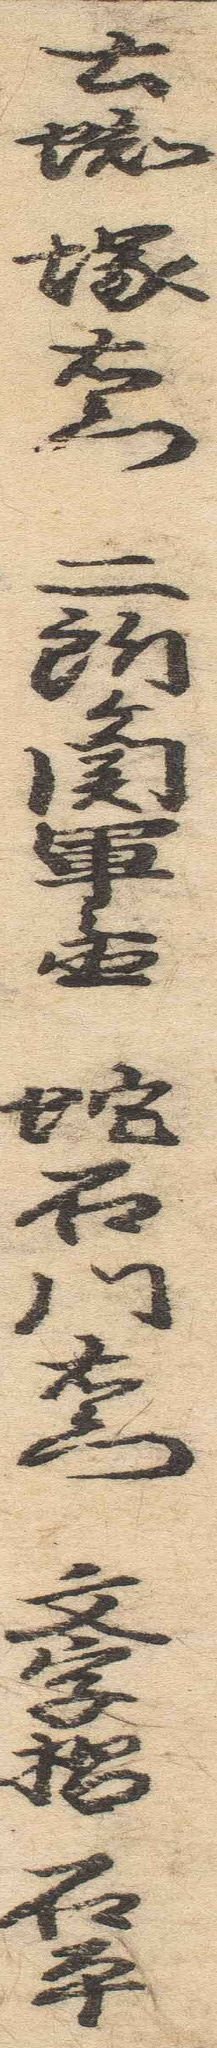土蜘塚右衛門二所ケ関軍之丞蛇石門右衛門文字摺石平
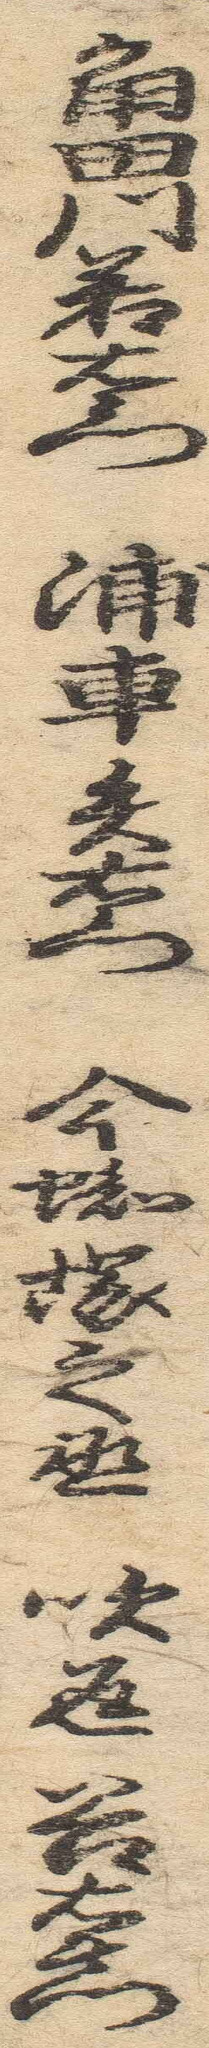角田川若右衛門浦車矢右衛門今蜘塚之丞吹返谷右衛門
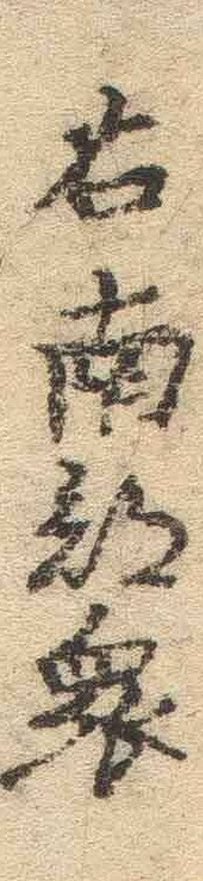右南部衆
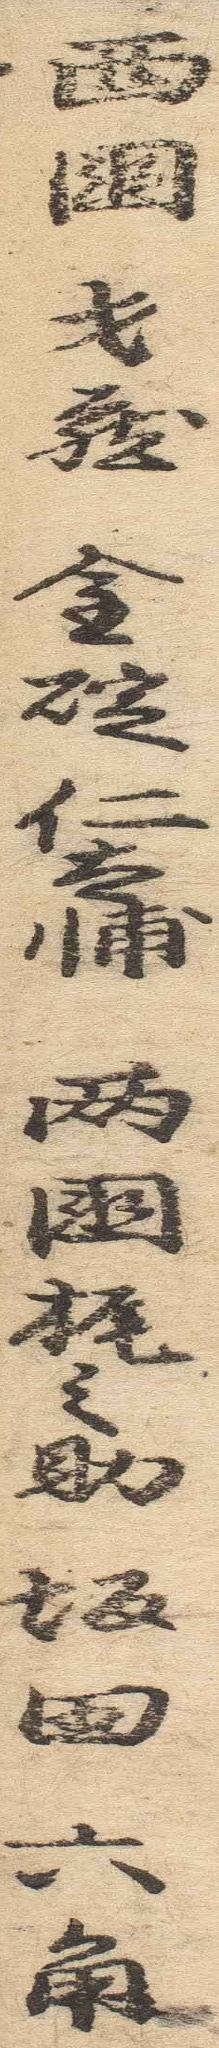両國才蔵金碇仁太輔両國梶之助坂田六角
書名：古今相撲大全
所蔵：東京学芸大学附属図書館 国文学研究資料館
